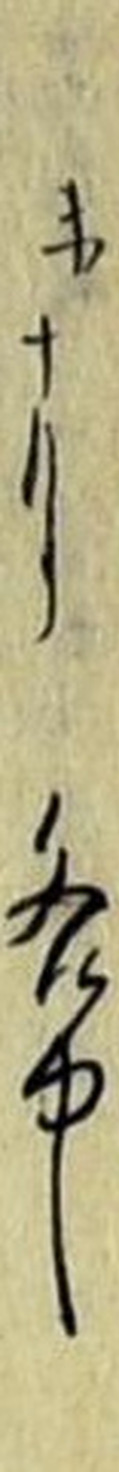未十月各中
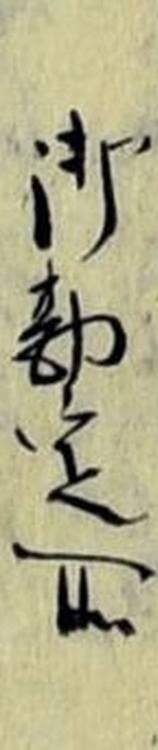御勘定所
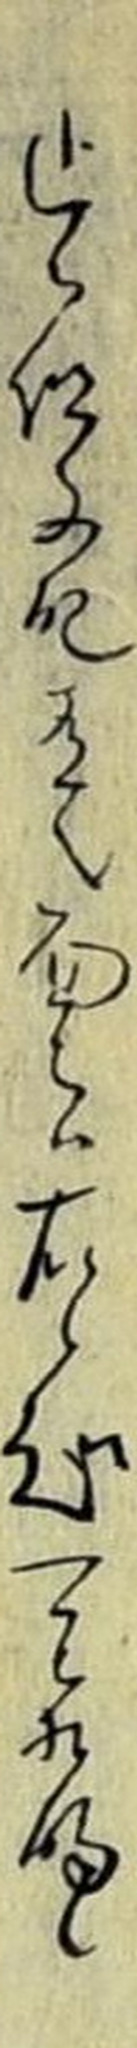追而組支配有之面々は右之趣可被相触候
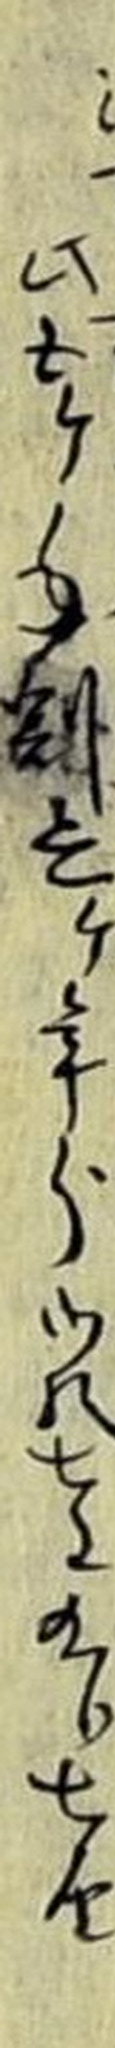此五ヶ年割壱ヶ年分弐拾七匁九分七厘
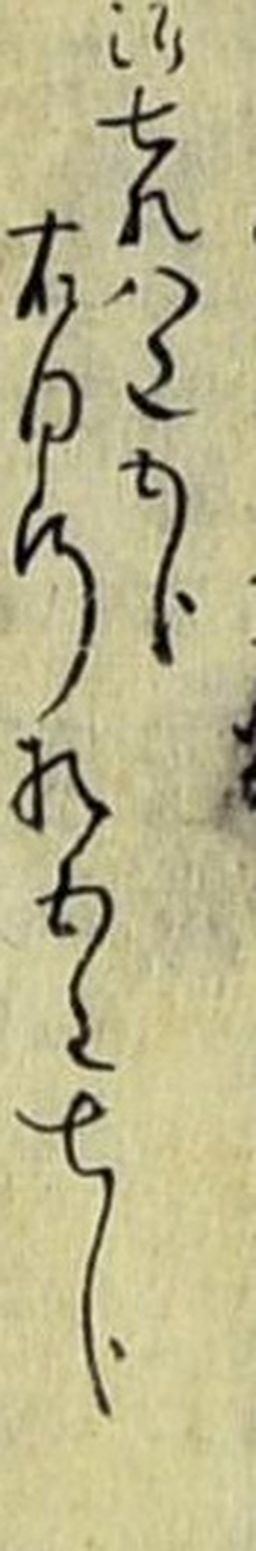右同断十五匁七分
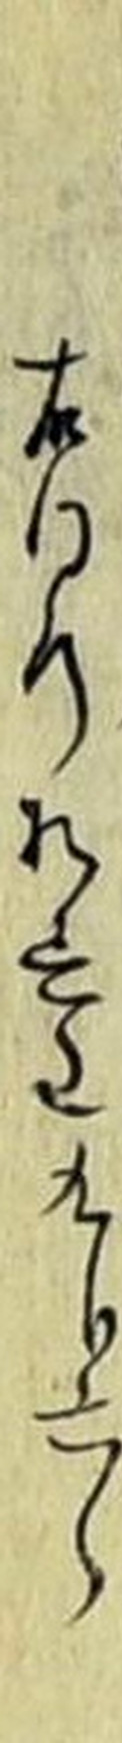右同断拾壱匁九分六厘
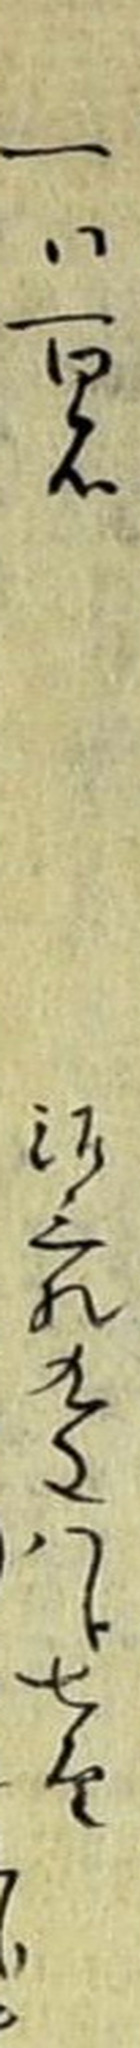一同百石銀三拾九匁八分七厘
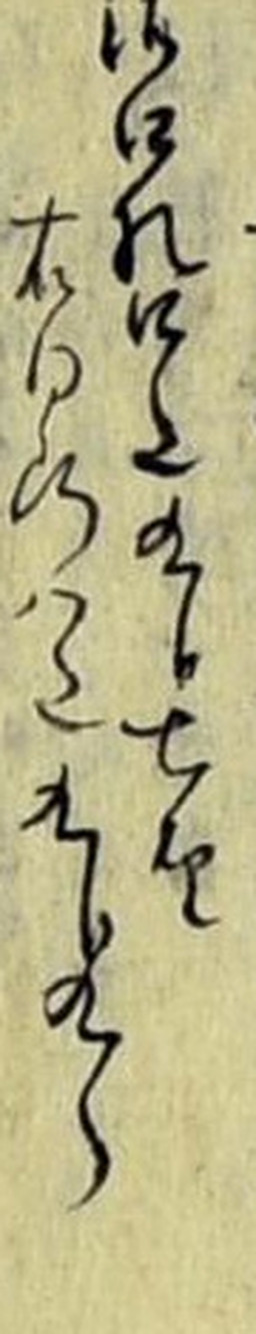右同断八匁九分九厘
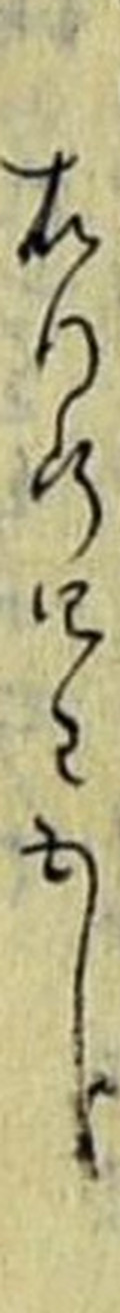右同断四匁五分

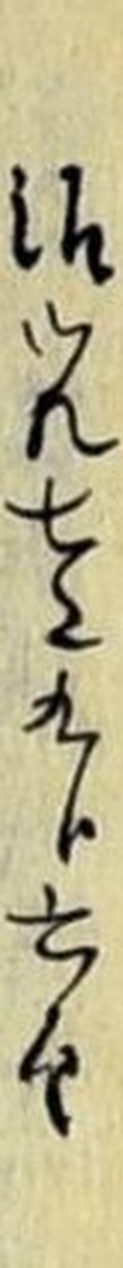一同拾七匁四分弐厘
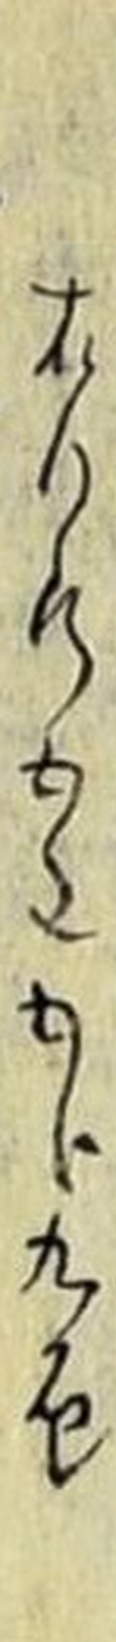右同断五匁五分九厘
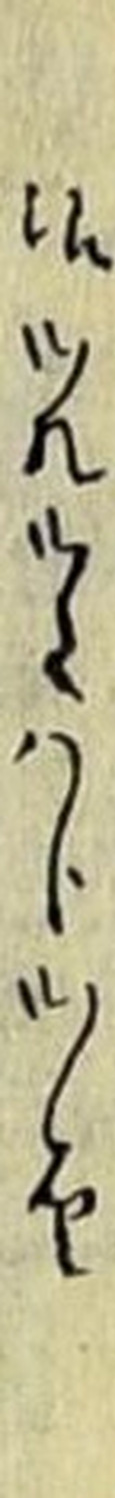一同弐拾弐匁八分弐厘
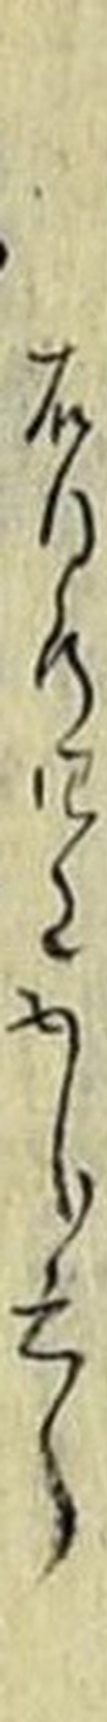右同断四匁五分六厘
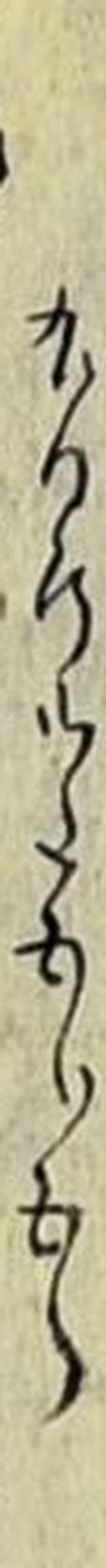右同断弐匁五歩五厘
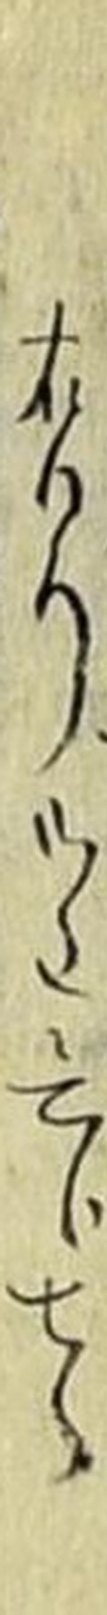右同断弐匁六分七厘
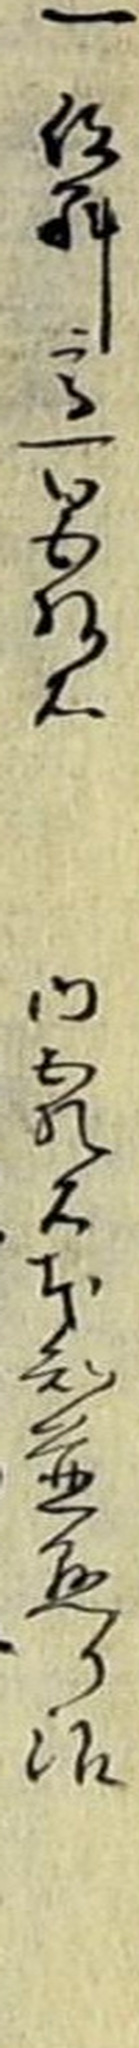一役料高百五拾石内五拾石本知並懸り銀
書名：命令之部 四
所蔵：福井県文書館 Fukui Prefectural Archives
